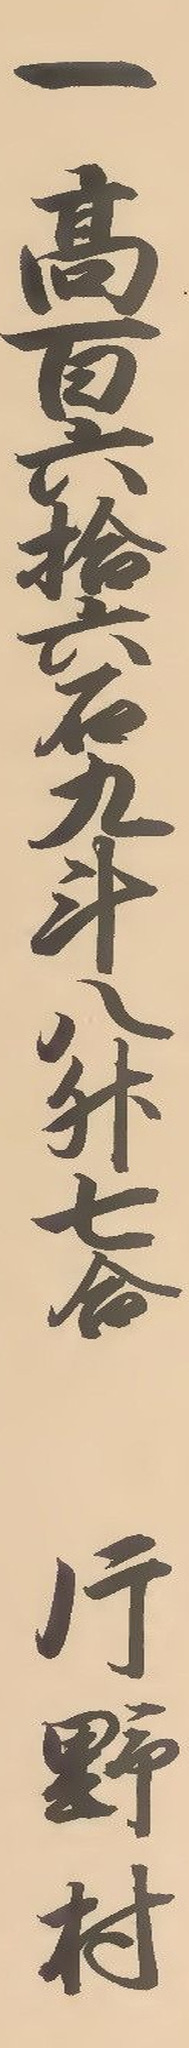一高百六拾六石九斗八升七合片野村
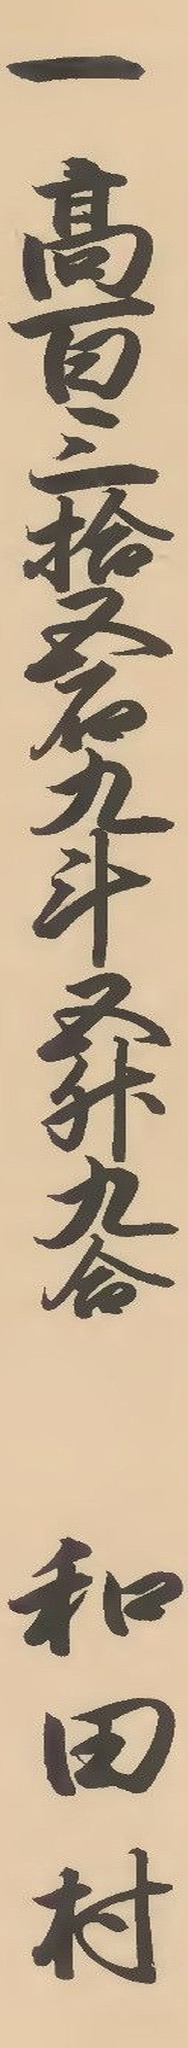一高百三拾五石九斗五升九合和田村
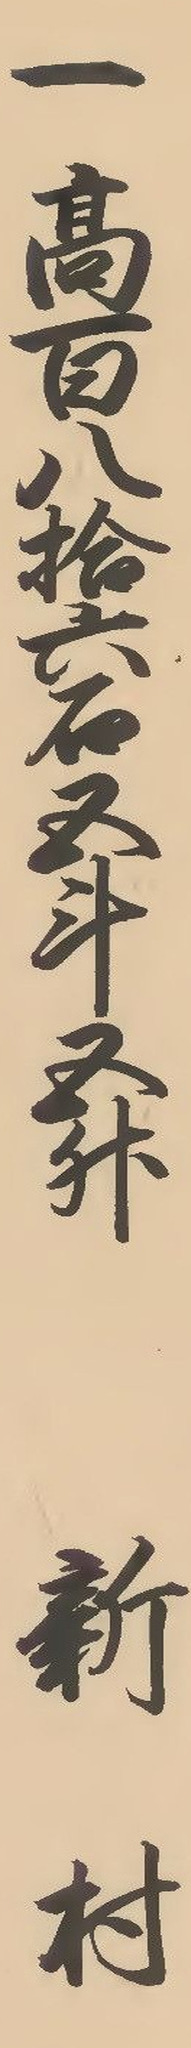一高百八拾六石五斗五升新村
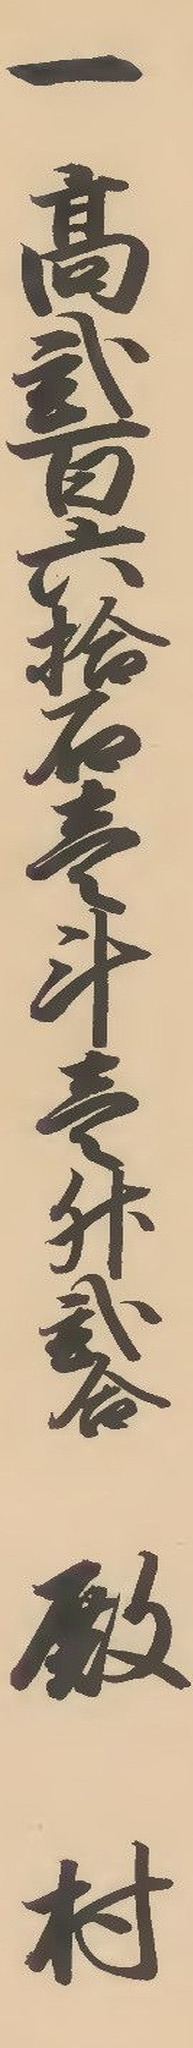一高弐百六拾石壱斗壱升弐合殿村

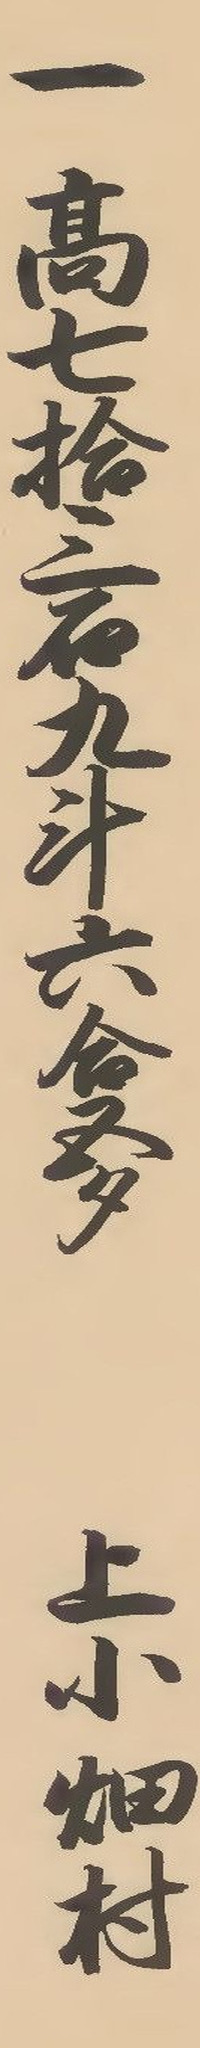一高七拾三石九斗六合五勺上小畑村
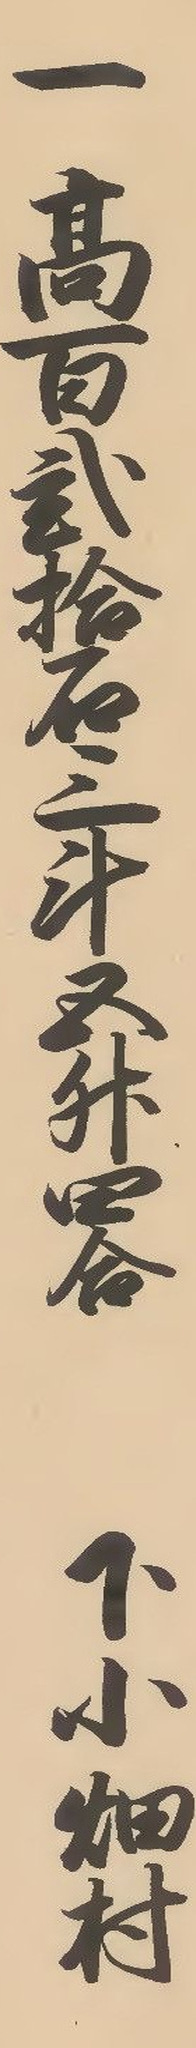一高百弐拾石三斗五升四合下小畑村
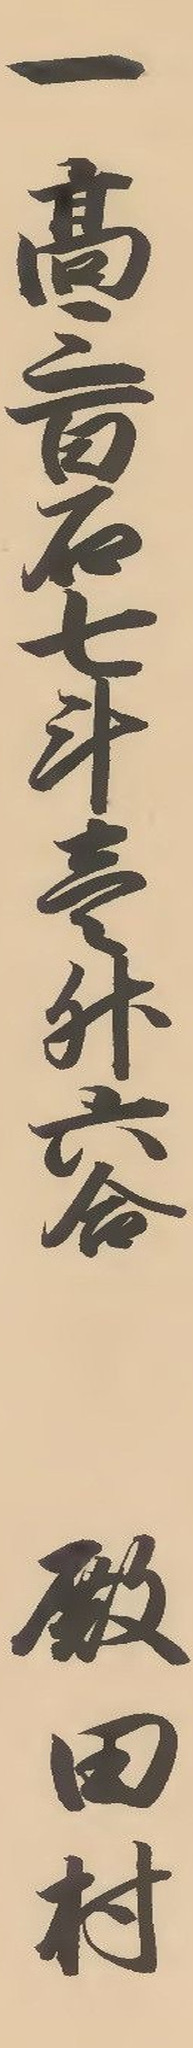一高三百石七斗壱升六合殿田村
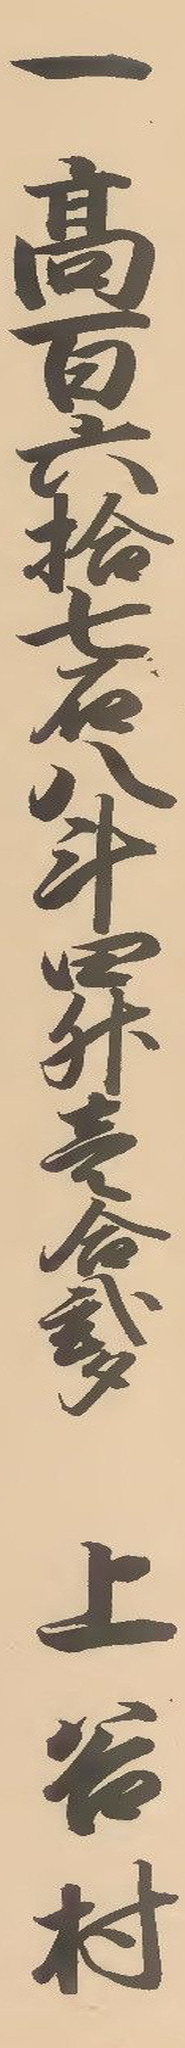一高百六拾七石八斗四升壱合弐勺上谷村
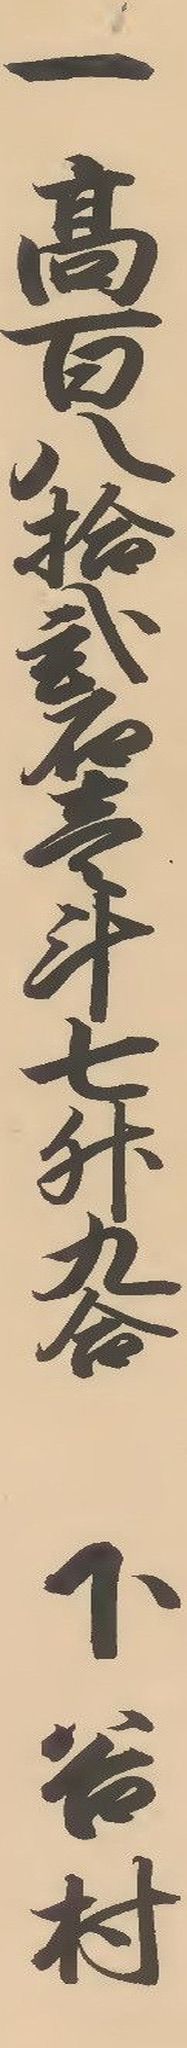一高百八拾弐石壱斗七升九合下谷村
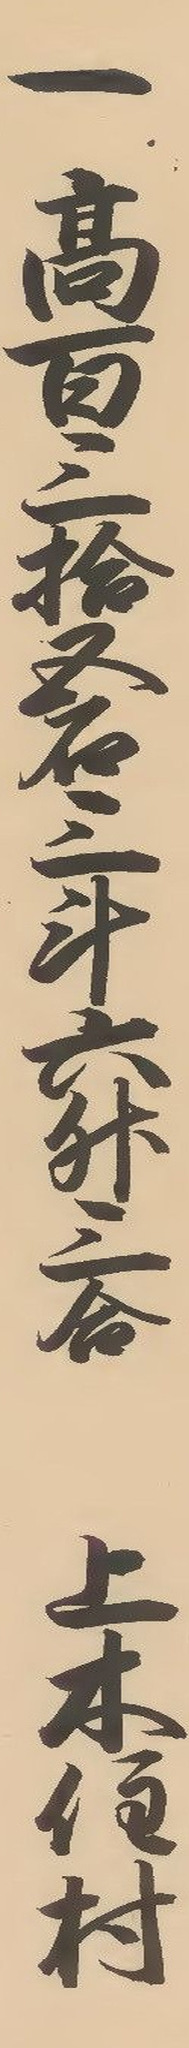一高百三拾五石三斗六升三合上木住村
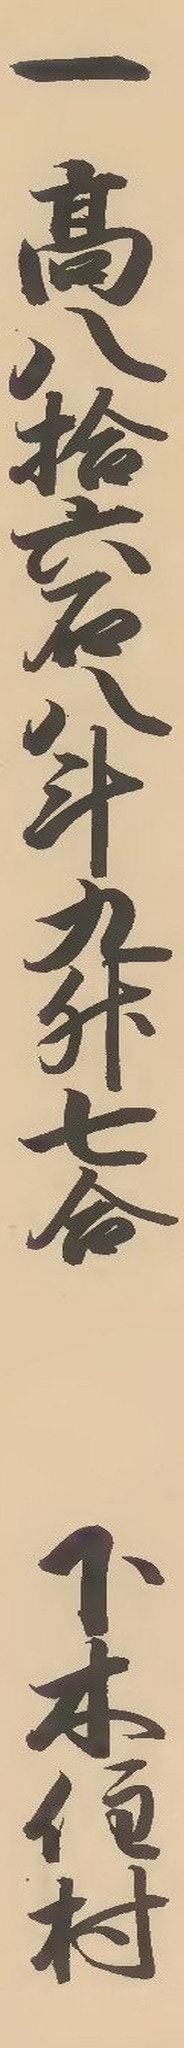一高八拾六石八斗九升七合下木住村

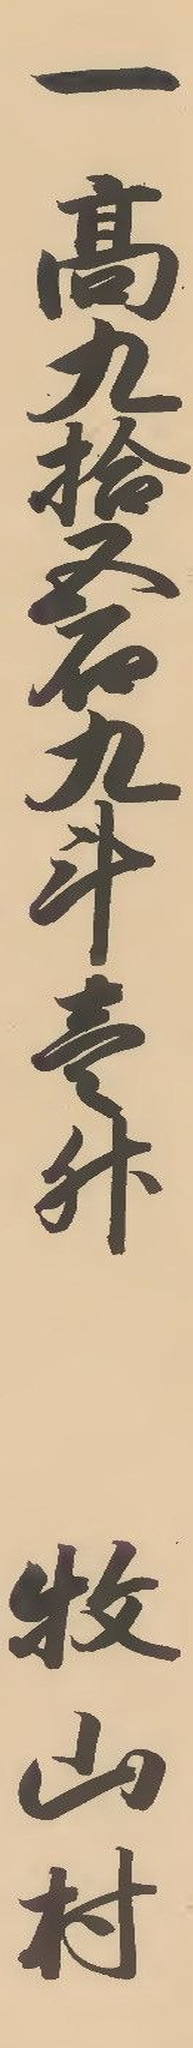一高九拾五石九斗壱升牧山村
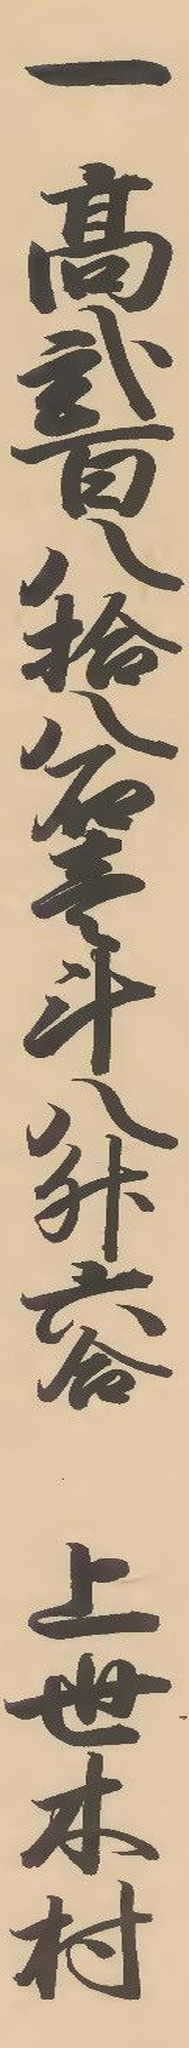一高弐百八拾八石壱斗八升六合上世木村
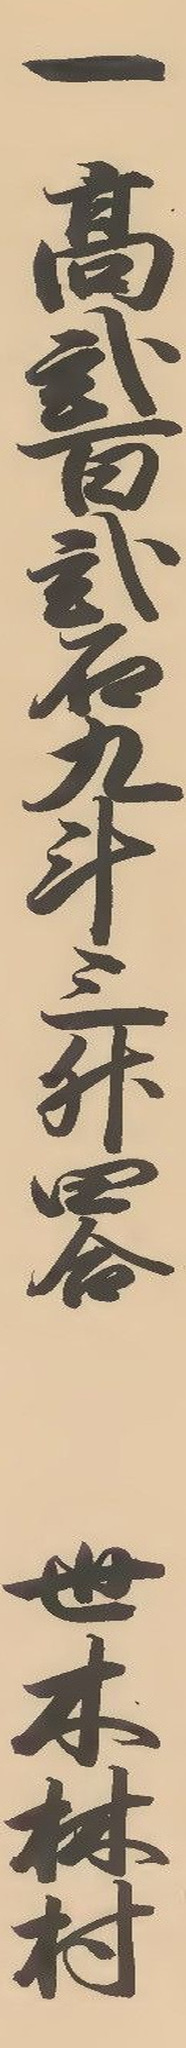一高弐百弐石九斗三升四合世木林村
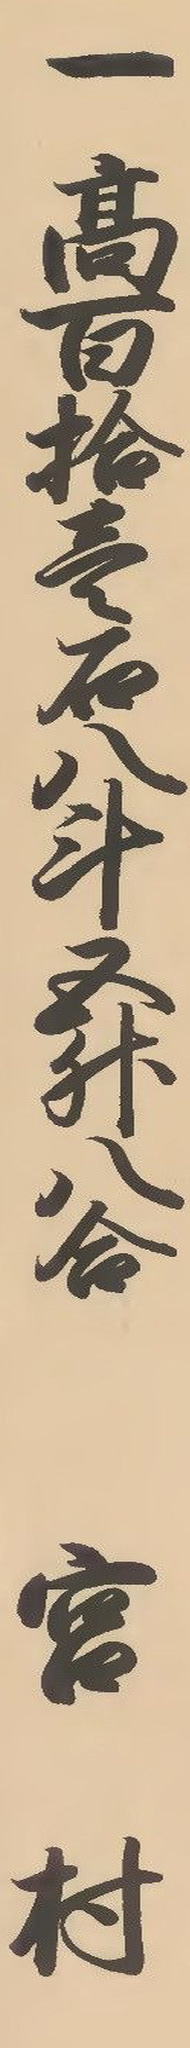一高百拾壱石八斗五升八合宮村
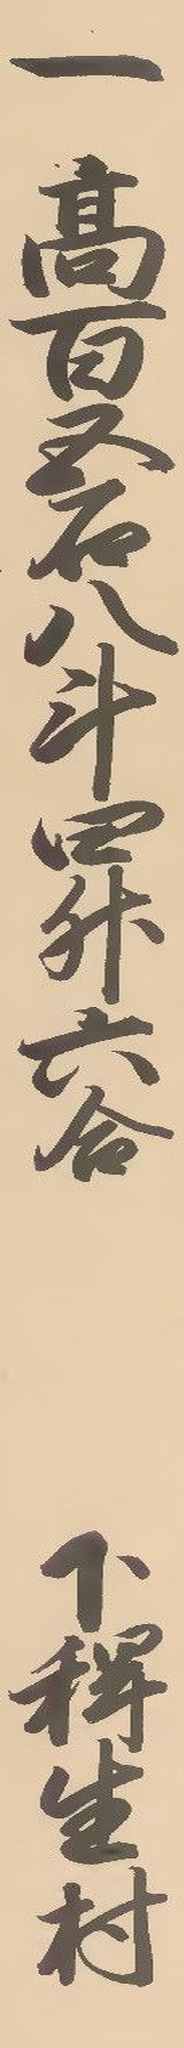一高百五石八斗四升六合下稗生村
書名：丹波国郷帳
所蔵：国立公文書館 National Archives of Japan
